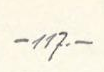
117
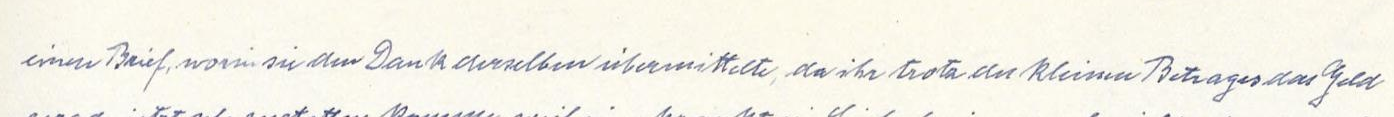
einen Brief, worin sie den Dank derselben übermittelte, da ihr trotz des kleinen Betrages das Geld
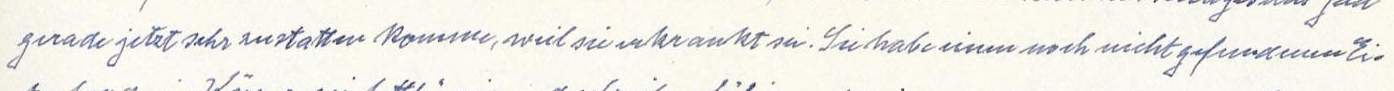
gerade jetzt sehr zustatten komme, weil sie erkrankt sei. Sie habe einen noch nicht gefunden Eit-
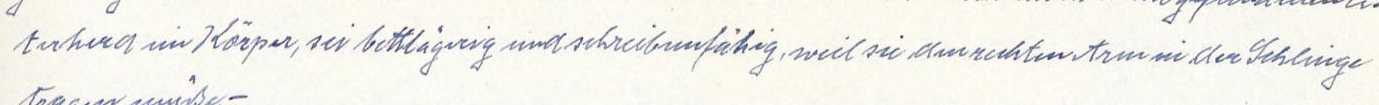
terherd im Körper, sei bettlägerig und schreibunfähig, weil sie den rechten Arm in der Schlinge
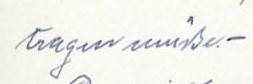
tragen müsse.
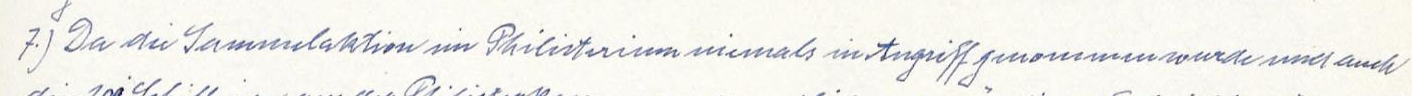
7.) Da die Sermelaktion im Philisterium niemals in Angriff genommen wurde und auch
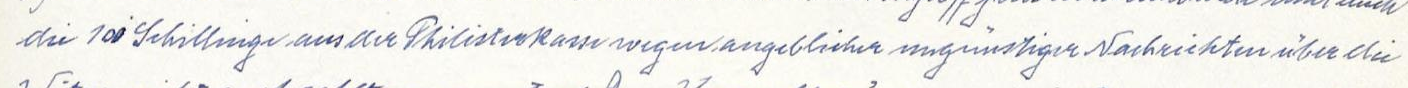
die 100 Schillinge aus der Philisterkasse wegen angeblicher ungünstiger Nachrichten über die
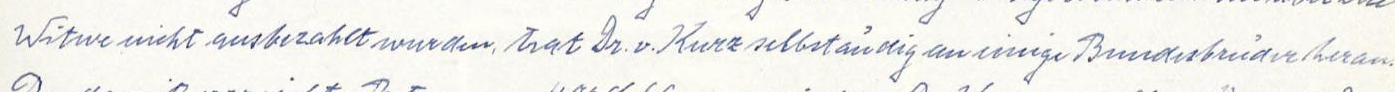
Witwe nicht ausbezahlt wurden, trat Dr. v. Kurz selbständig an einige Bundesbrüder heran.
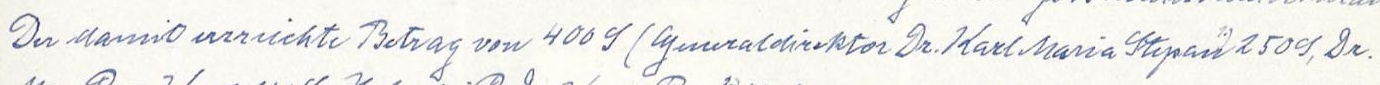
Der damit erreichte Beitrag von 400 S (Generaldirektor Dr. Karl. Maria Stepan 1) 250 S,
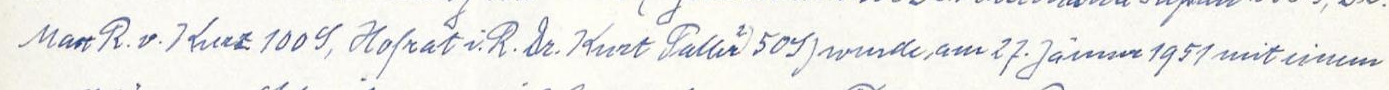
Max R. v. Kurz 100 S, Hofrat i. R. Kurt Paller 2)50 S wurde am 27. Jänner 1951 mit einem
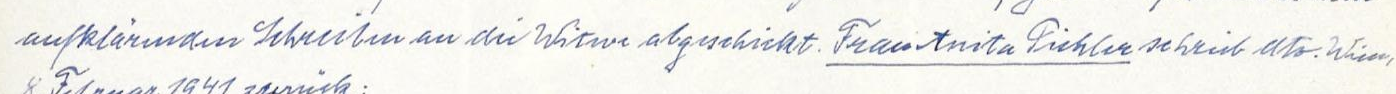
aufklärenden Schreiben an die Witwe abgeschickt. Frau Anita Pichler schrieb dto. Wien.
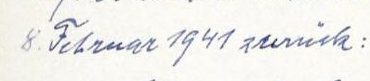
8. Februar 1941 zurück:
